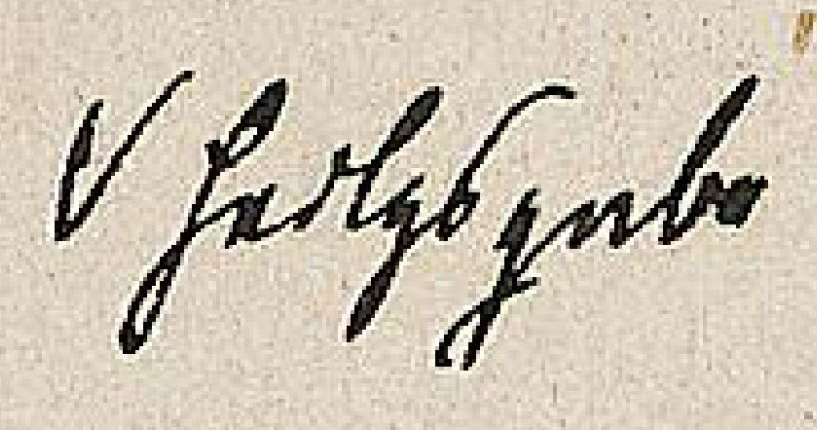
V heilgsgabe
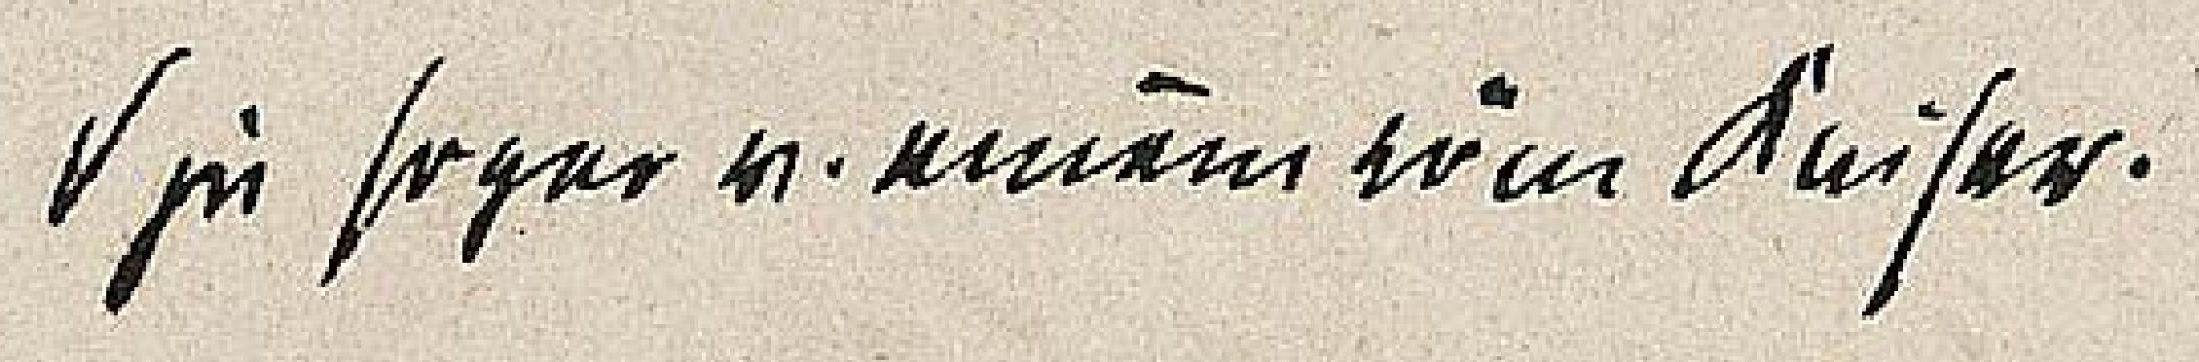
V ja sogar v. einem röm Kaiser.
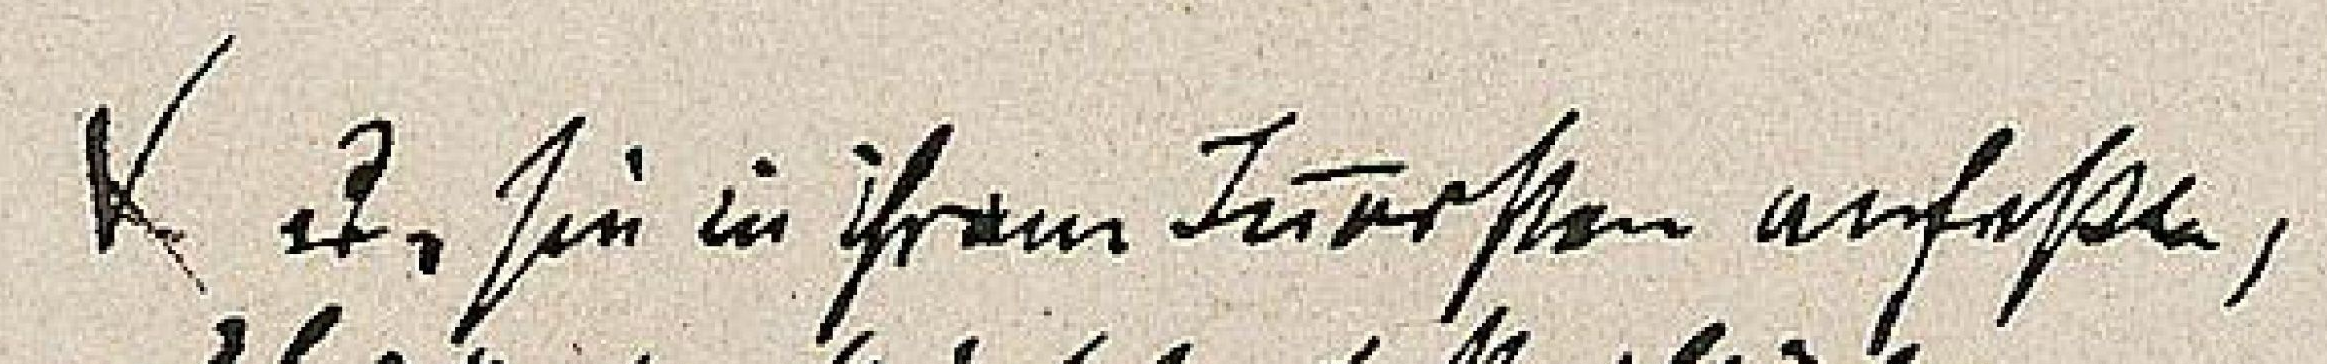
V u. sie in ihrem Inersten erfaßte,
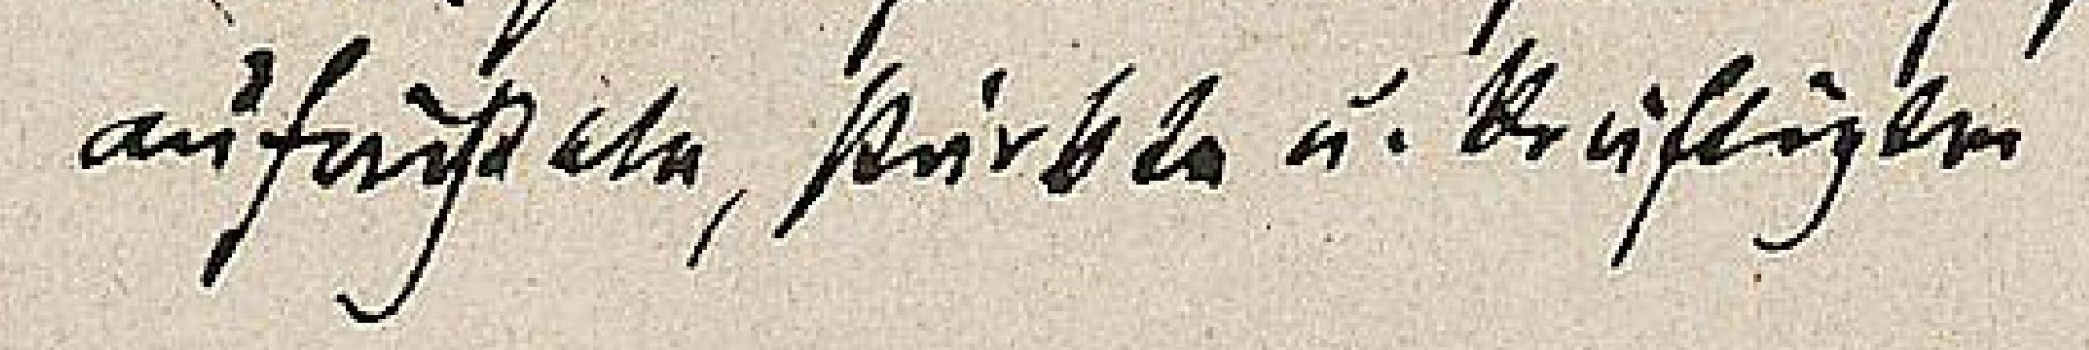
aufrüstete, stärkte u. kräftigte
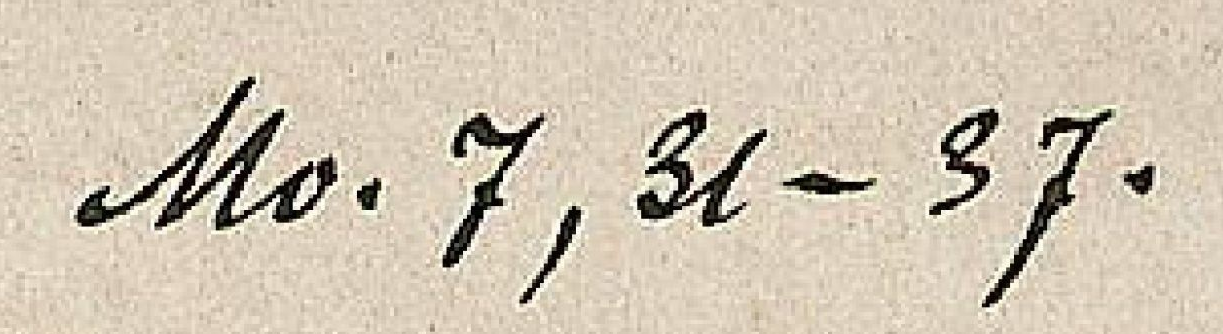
Mc. 7,31-37
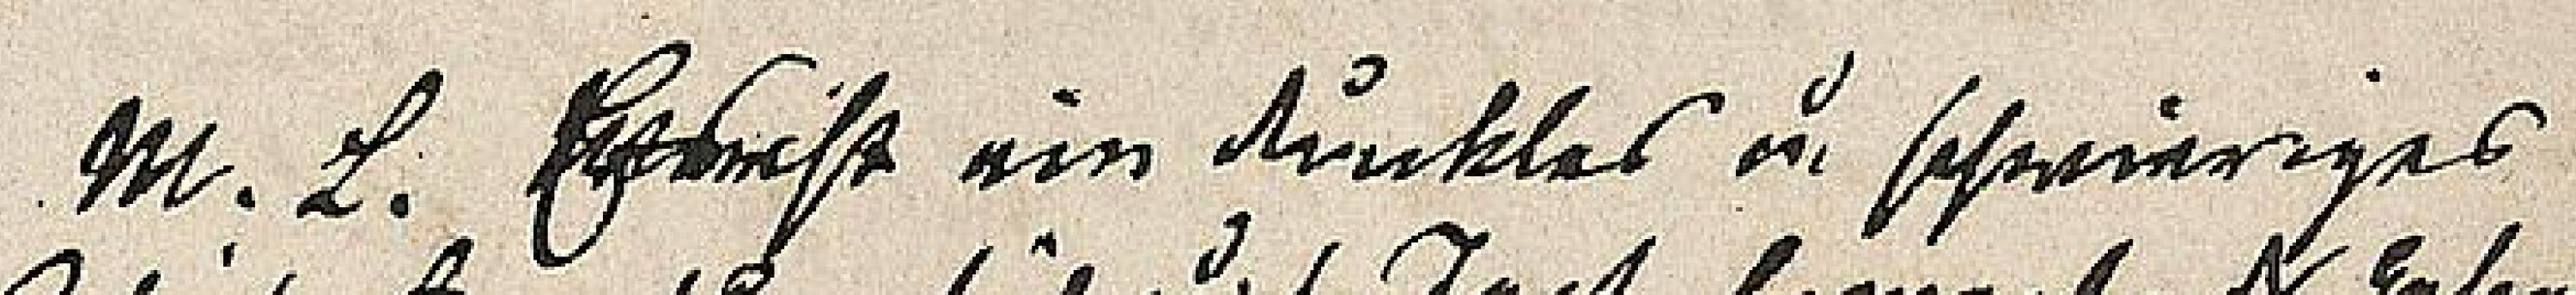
M. L. Es ist ein dunkles u. schwieriges
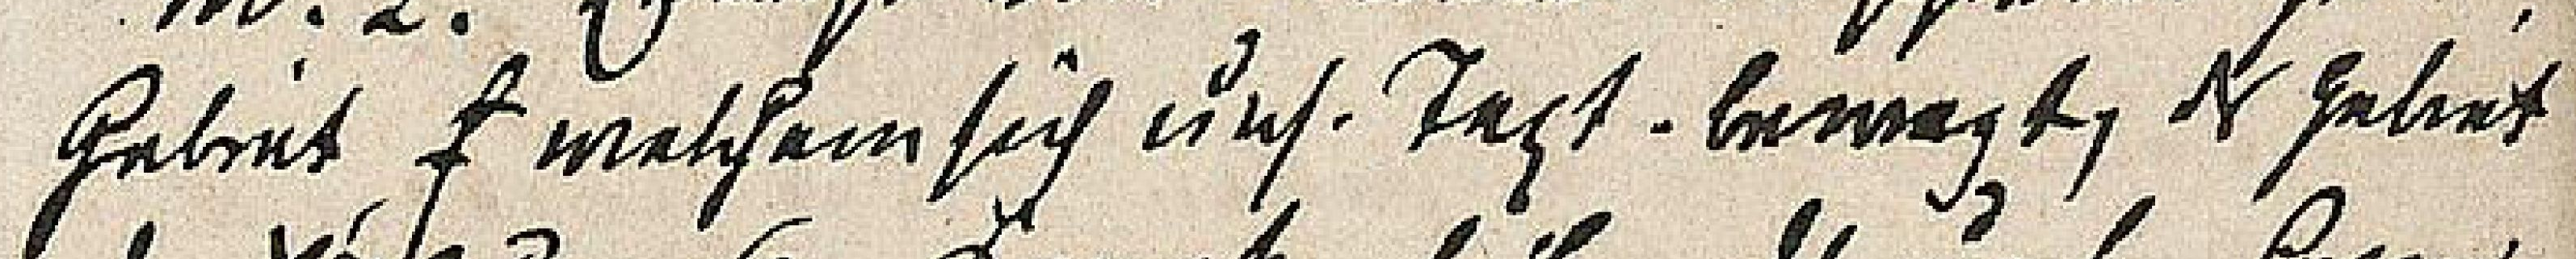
Gebiet f welchem sich uns. Text. bewegt, das Gebiet
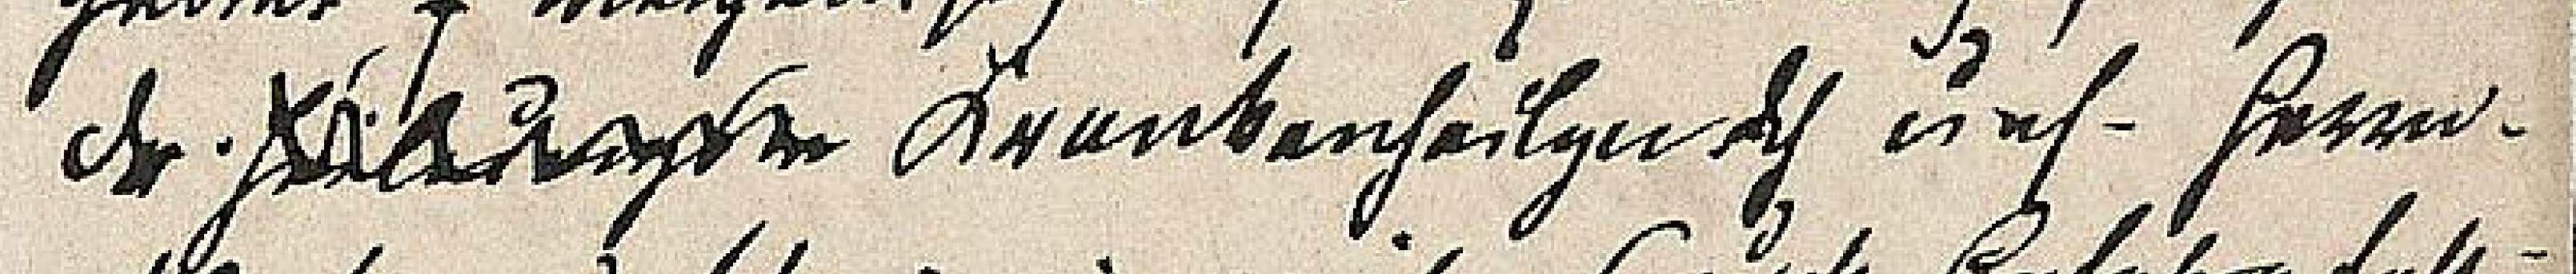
der Heilungsw. Krankenheilgn dch uns. Herrn.
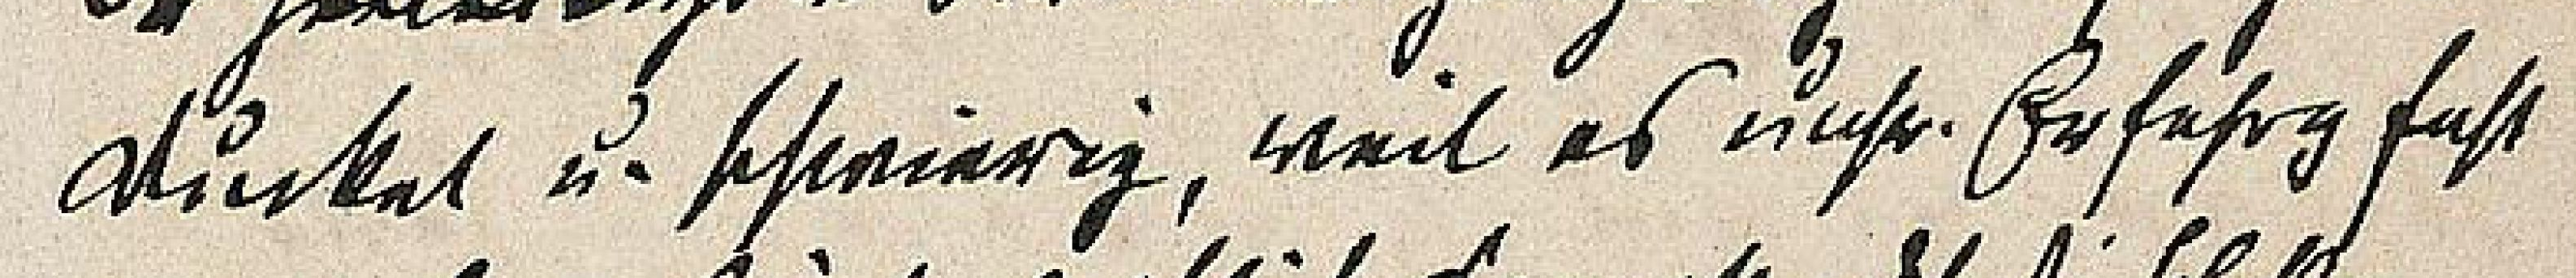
Dunkel und schwierig, weil es unsr Erfahrg fast
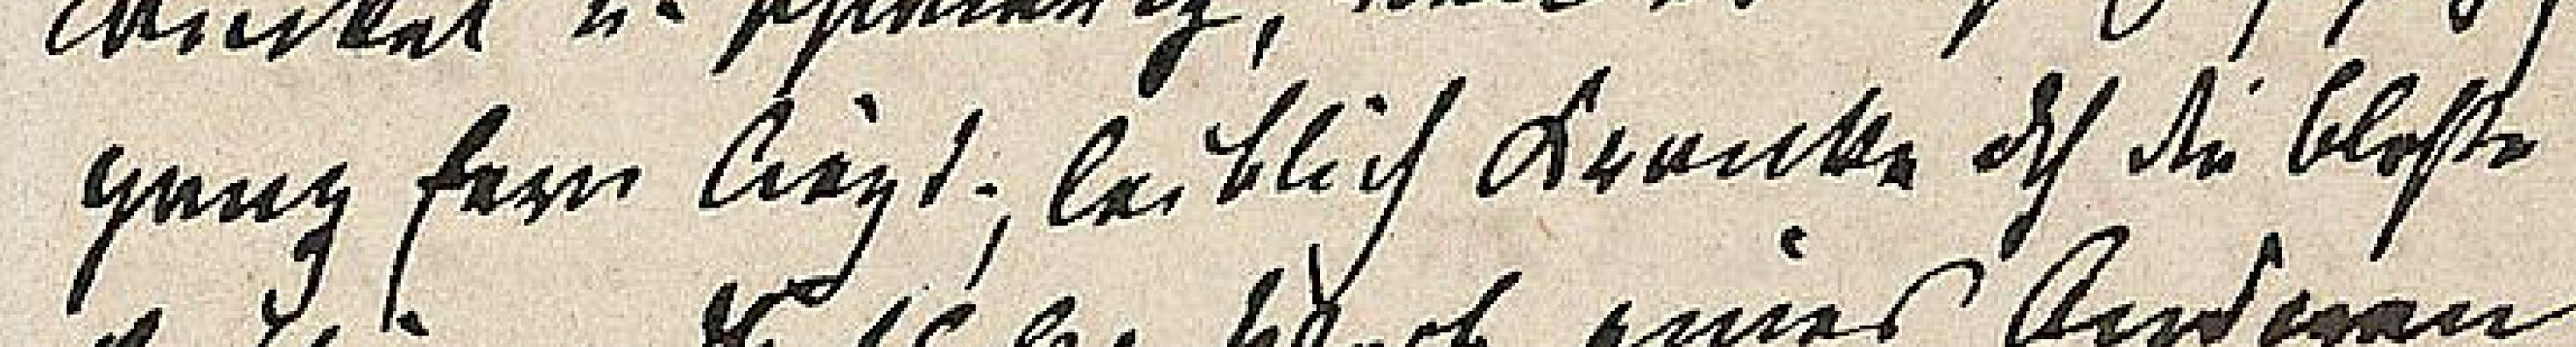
ganz fern liegt; leiblich Kranke dch die bloße
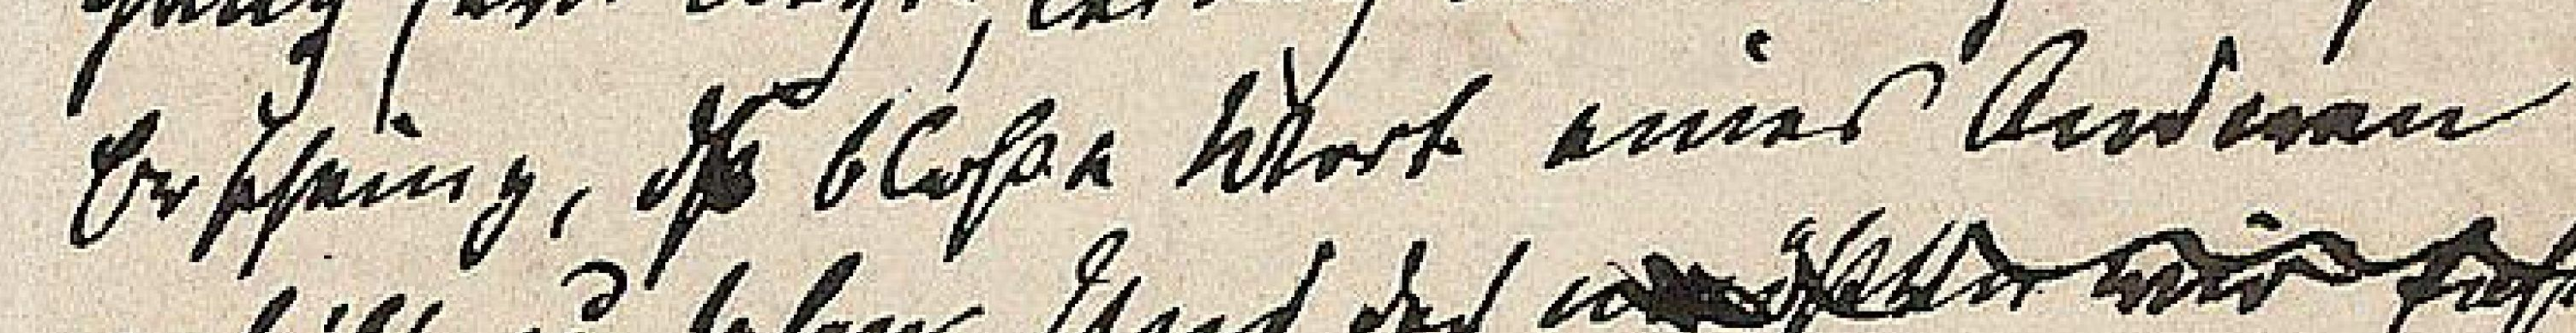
Erscheing, das bloße Wort eines Andren
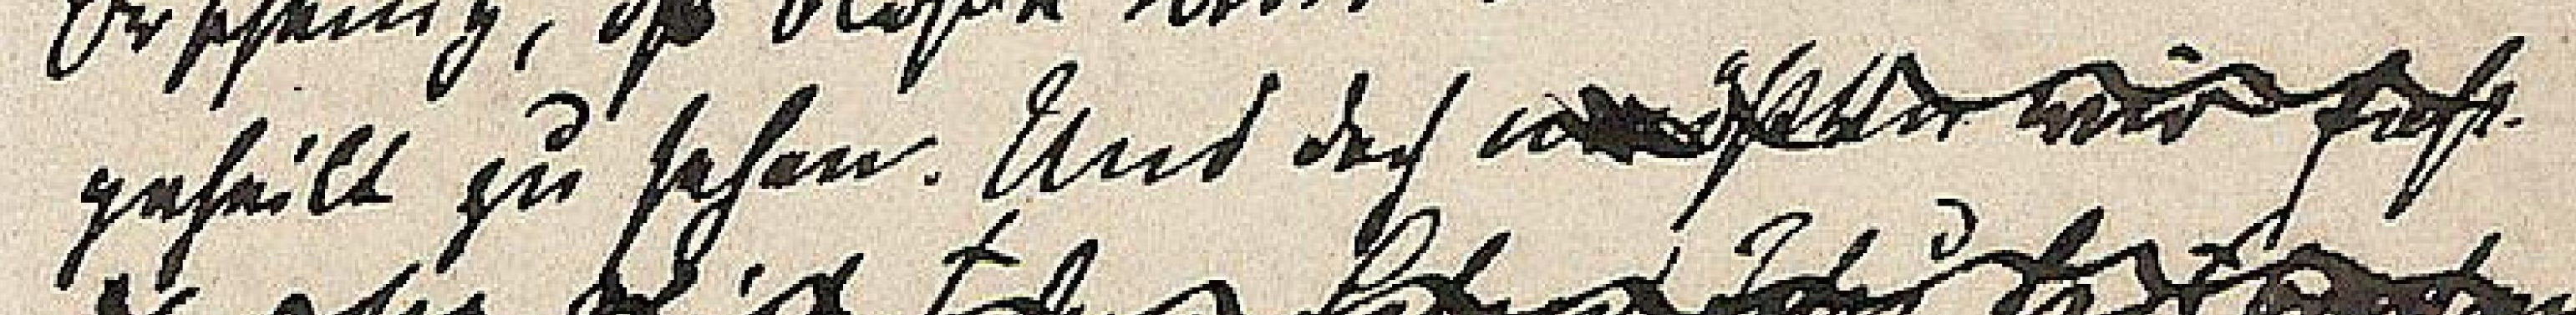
geheilt zu sehen. Und doch möchten wir fast
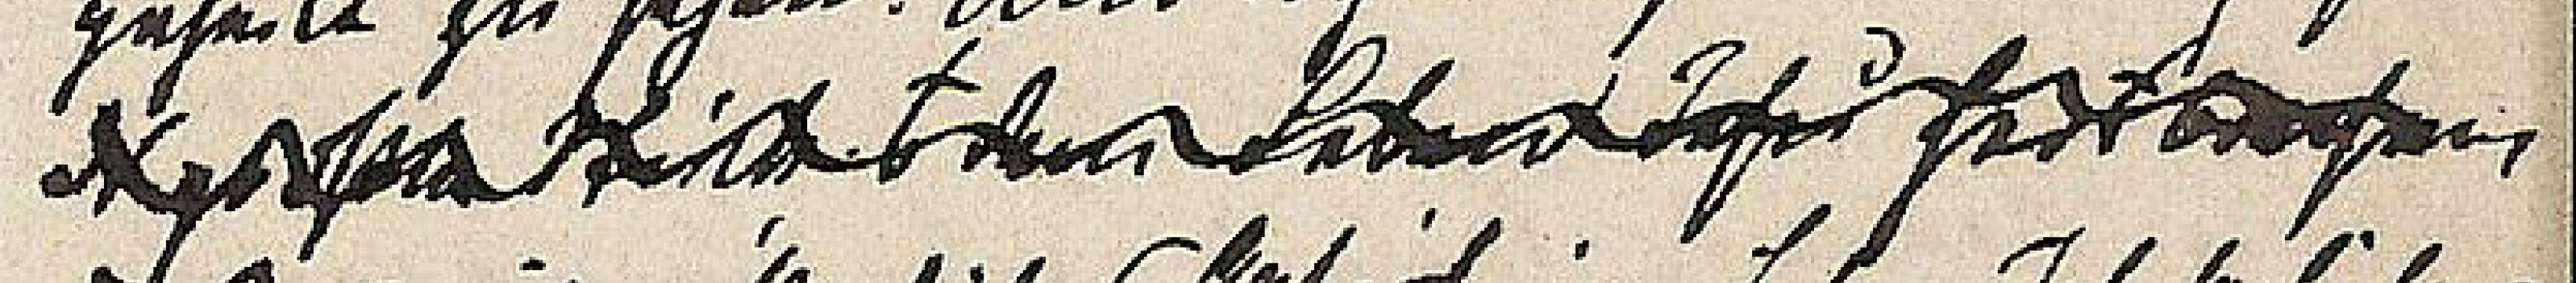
das ja dses Stück s dem Leben Jesu hers nehmen
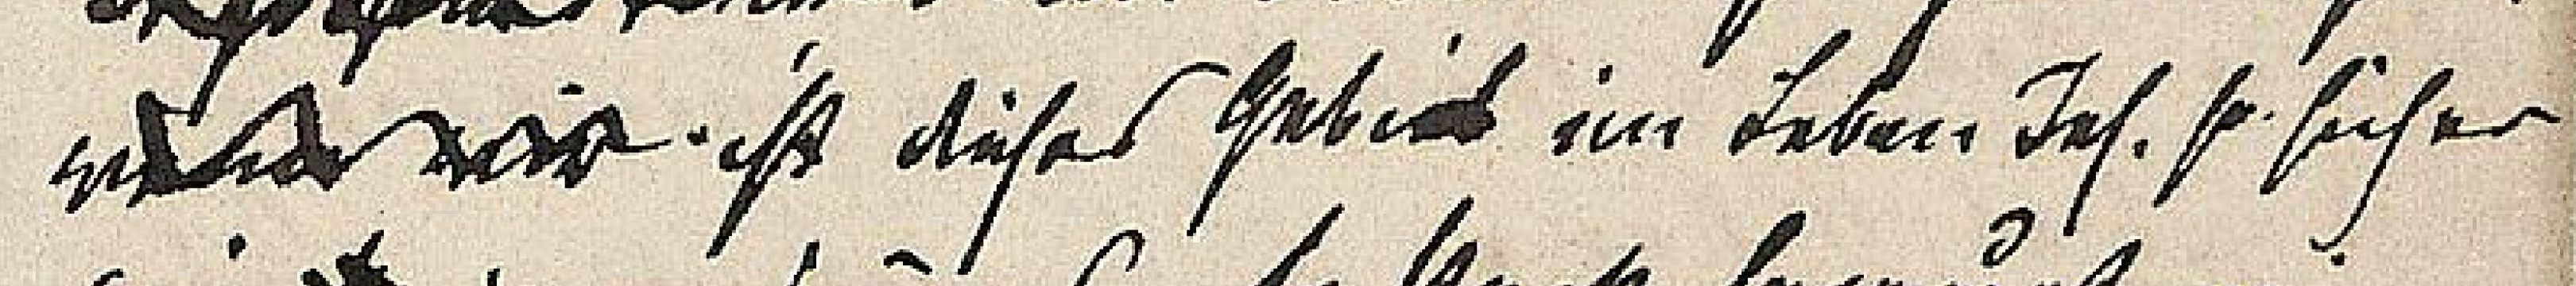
wenn wir ist dieses Gebiet im Leben Jes. so sicher
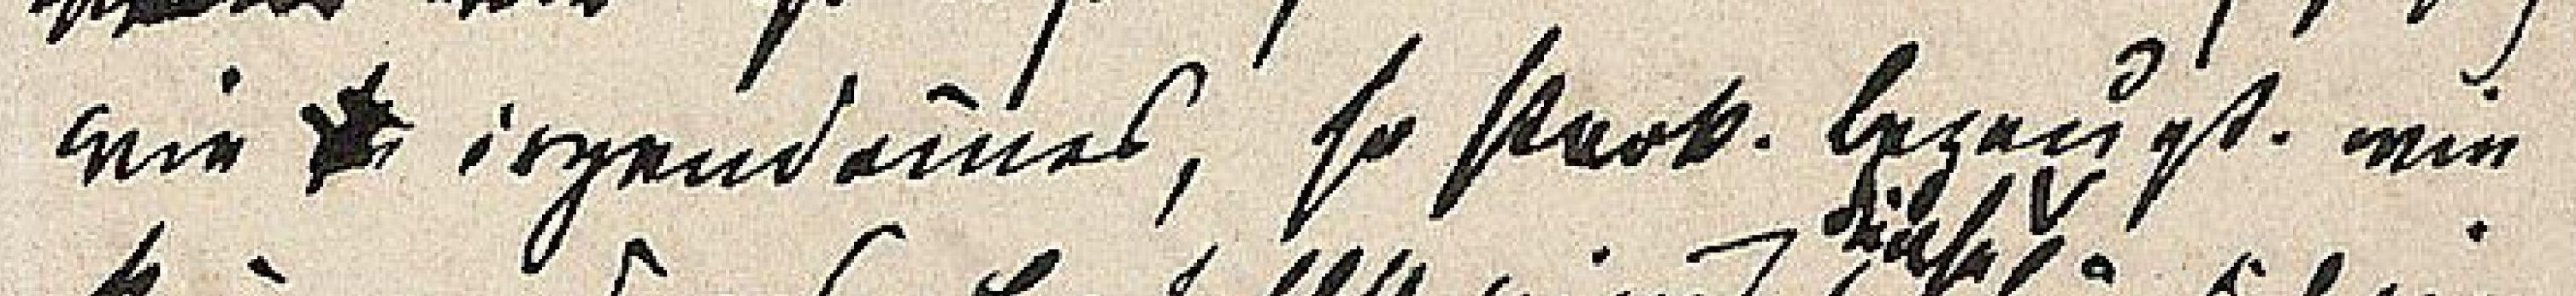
wie so irgendeines, so stark. bezeugt. wie
